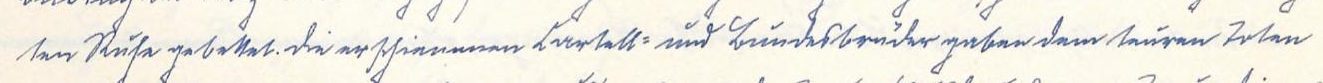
ten Ruhe gebettet. Die erschienenen Cartell- und Bundesbrüder gaben dem teuren Toten
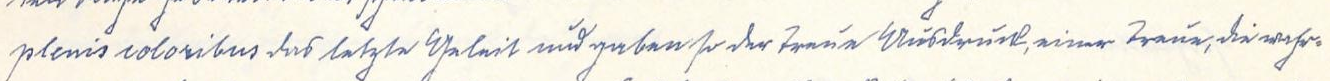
plenis coloribus das letzte Geleit und gaben so der Treue Ausdruck, einer Treue, die wahr
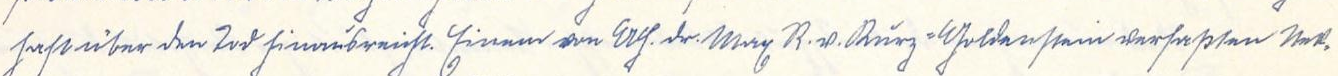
haft über den Tod hinausreicht. Einen von AH Dr. Max R v. Kurz Goldenstein verfaßten Nek-
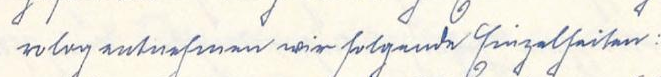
rolog entnehmen wir folgende Einzelheiten:
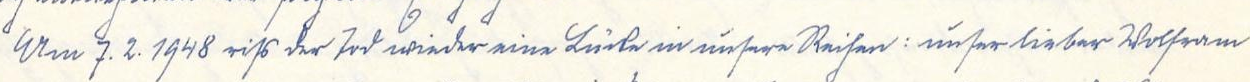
Am 7.2.1948 riss der Tod wieder eine Lücke in unsere Reihen: unser lieber Wolfram
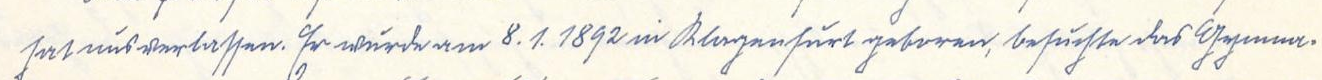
hat uns verlassen. Er wurde am 8.1.1892 in Klagenfurt geboren, besuchte das Gymna-
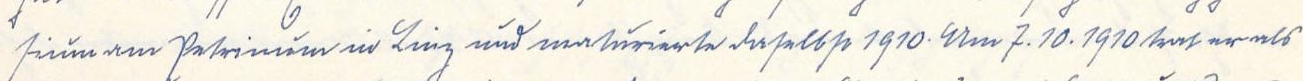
sium am Petrinum in Linz und maturierte daselbst 1910. Am 7.10.1910 traz er als
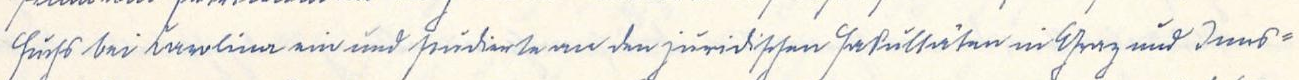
Fuchs bei Carolina ein und studierte an den juridischen Fakultäten in Graz und Inns-
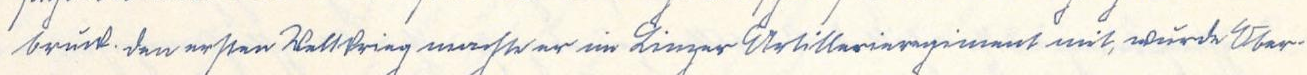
bruck. Den ersten Weltkrieg machte er im Linzer Artillerieregiment mit, wurde Ober-
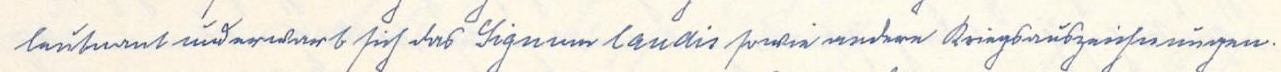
Leutnant und erwarb sich das Sigmum Laudis sowie andere Kriegsauszeichnungen.
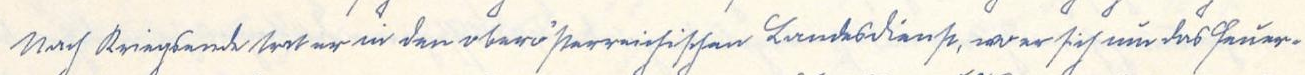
Nach Kriegsende trat er in den oberösterreichischen Landesdienst, wo er sich um das Feuer-
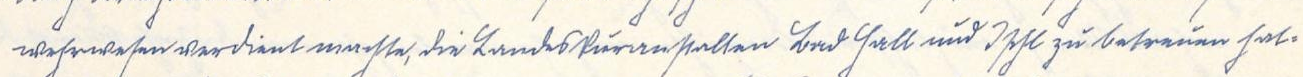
wehrwesen verdient machte, die Landeskuranstalten Bad Hall und Ischl zu betreuen hat-
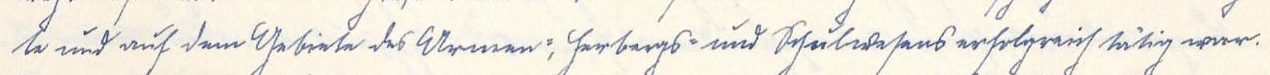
te und auf dem Gebiete des Armen-, Herbergs- und Schulwesens erfolgreich tätig war.
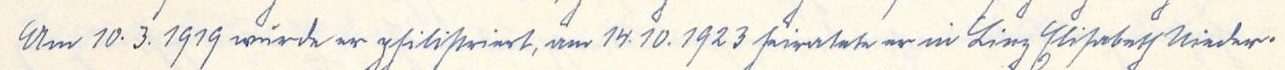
Am 10.3.1919 wurde er philistriert, am 14.10.1923 heiratete er in Linz Elisabeth Nieder-
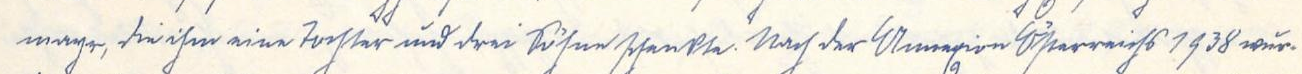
mayr, die ihm eine Tochter und drei Söhne schenkte. Nach der Annexion Österreichs 1938 wur-
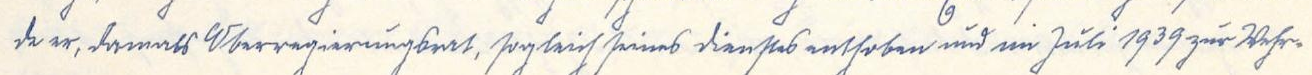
de er, damals Oberregierungsrat, sogleich seines Dienstes enthoben und in Juli 1939 zur Wehr-
